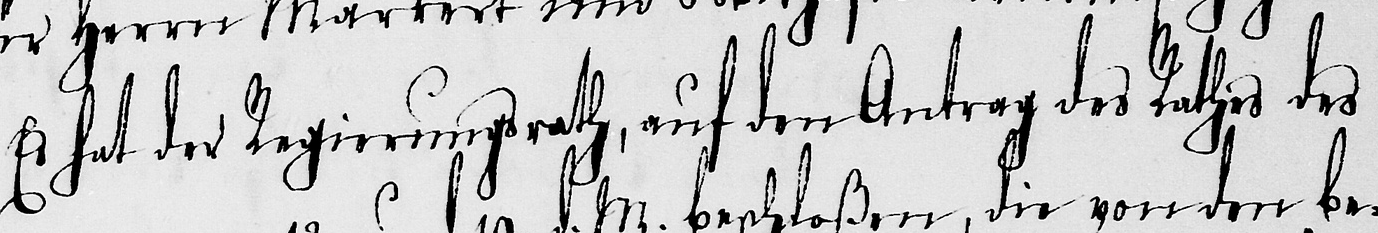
hat der Regierungsrath, auf den Antrag des Rathes
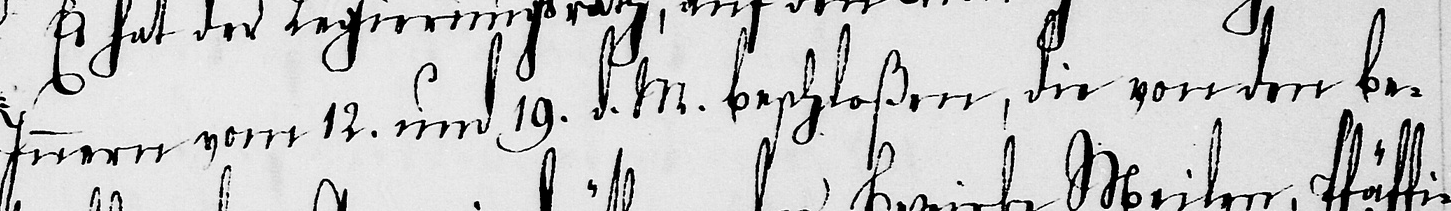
Innern vom 12. und 19. d. M. beschloßen, die von den be¬
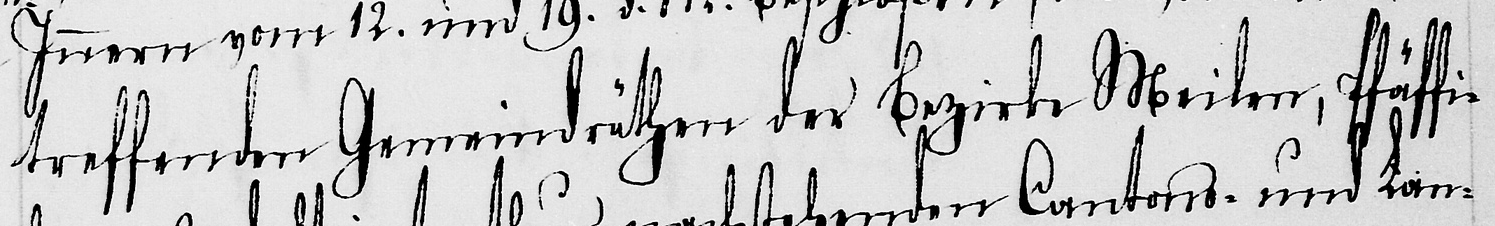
treffenden Gemeindräthen der Bezirke Meilen, Pfäff¬
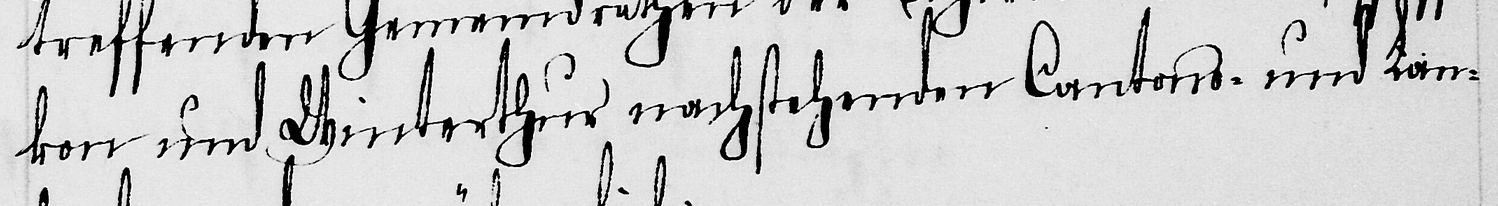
ikon und Winterthur nachstehenden Cantons- und Lan¬
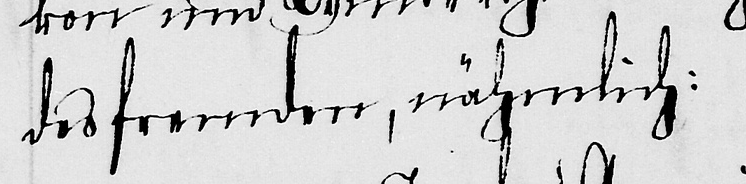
desfremden, nähmlich:
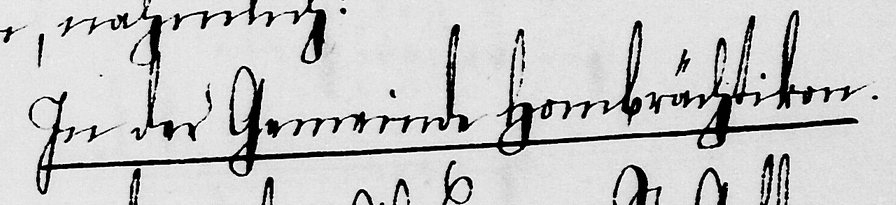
In der Gemeinde Hombrächtikon.
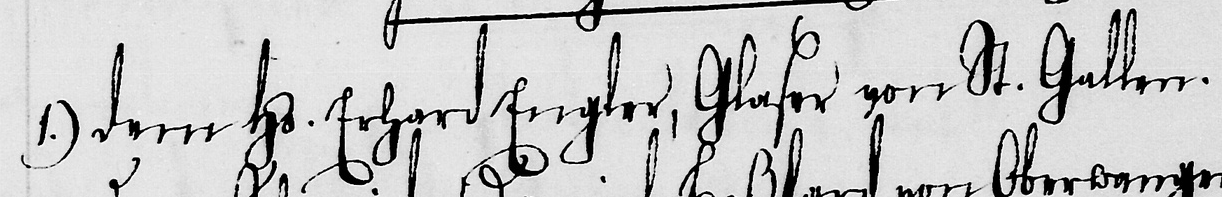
1.) dem Hs. Erhard Engler, Glaser von St. Gallen.
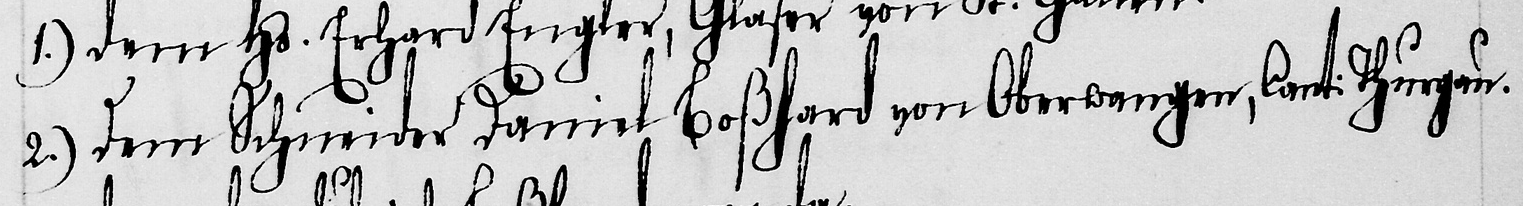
2.) Dem Schneider Daniel Boßhard von Oberwangen, Cant: Thurgau.
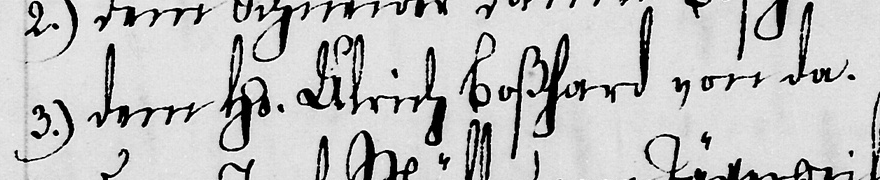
3.) dem Hs. Ulrich Boßhard von da.
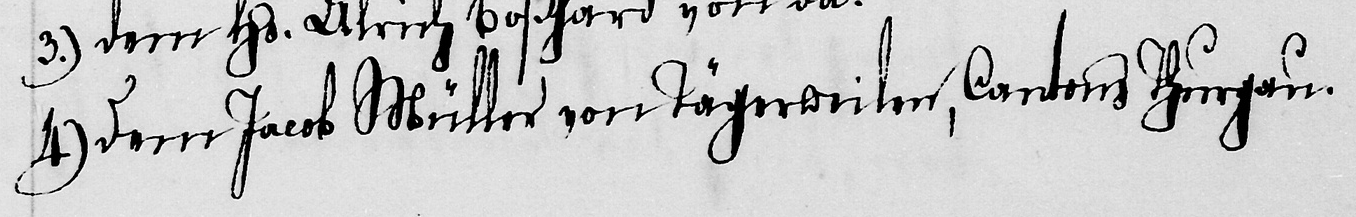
4.) Dem Jacob Müller von Tägerweilen, Cantons Thurgau.
